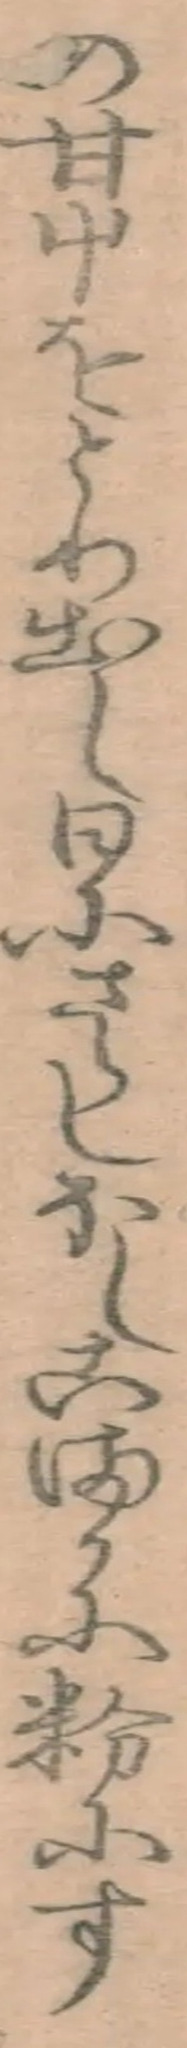の甘屮をとり出し日にさらしほしこまかに粉にす
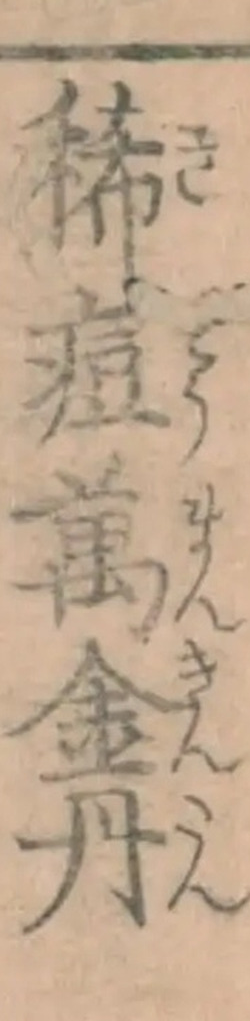稀痘万金丹

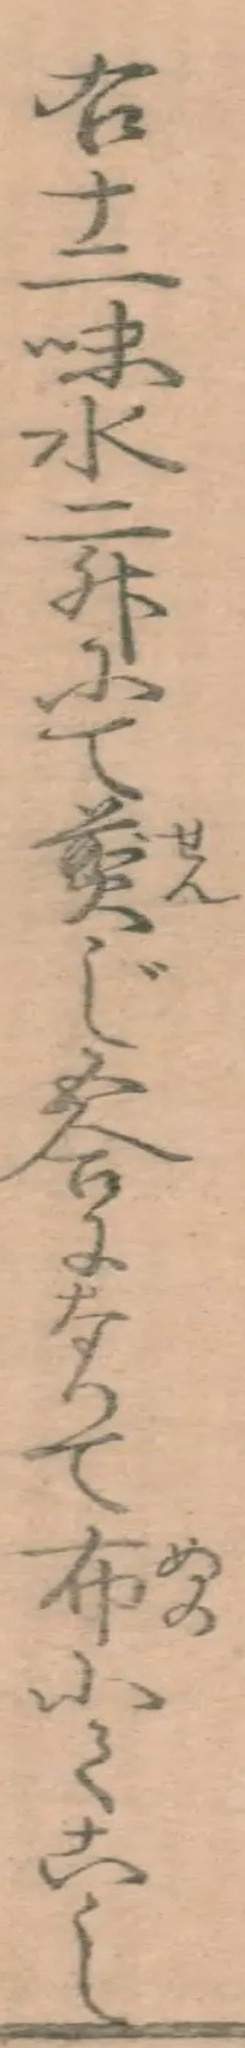右十二味水二升にて煎じ五合になりて布にてこし
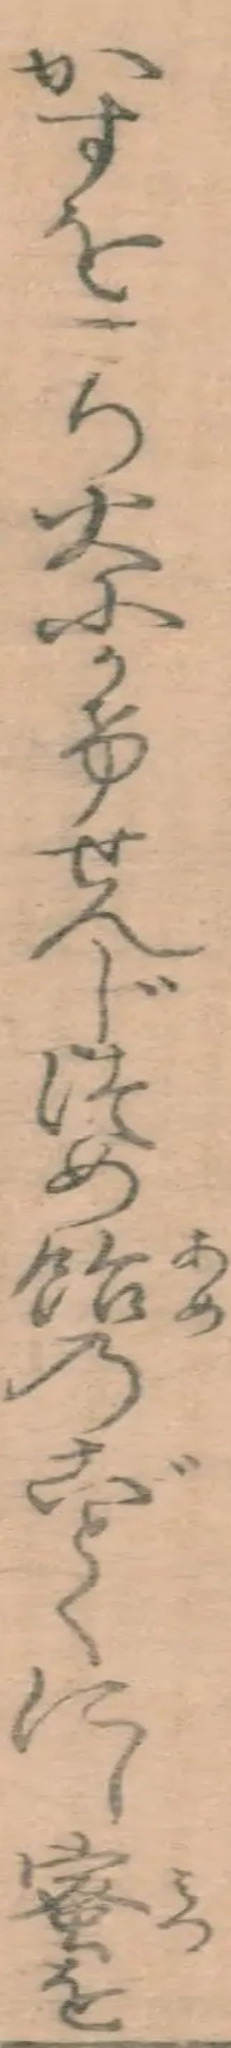かすを▢り火にかけせんじつめ飴のごとくにし蜜を
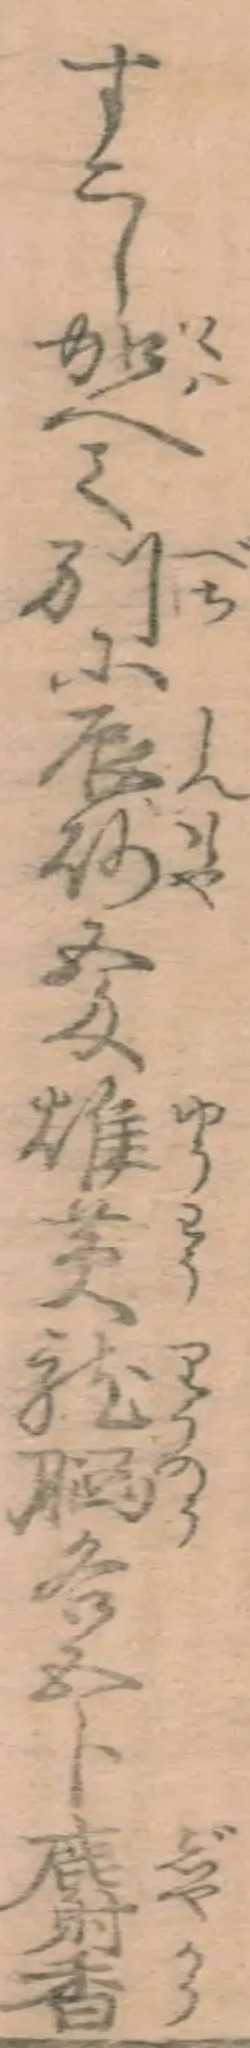すこし加へて別に辰砂五匁雄黄竜脳各五分麝香
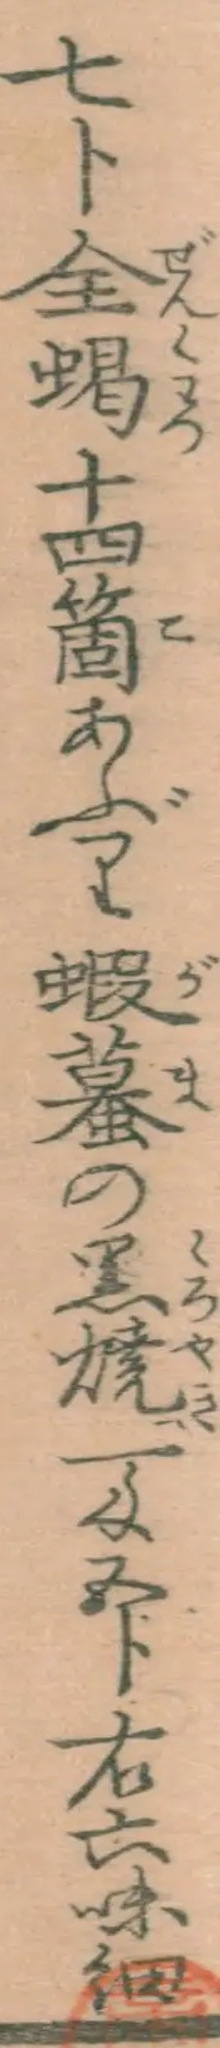七分全蝎十四箇あぶり蝦蟇の黒焼一匁五分右六味細
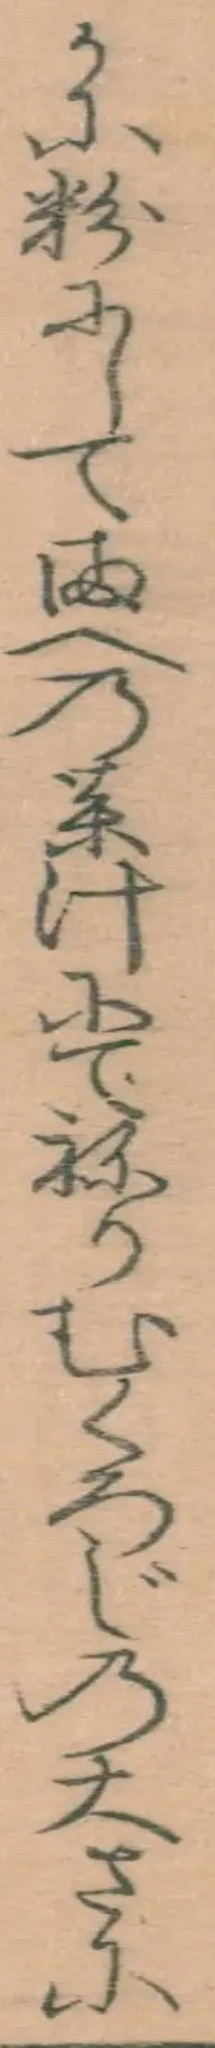かに粉にしてまへの薬汁にてねりむくろじの大さに
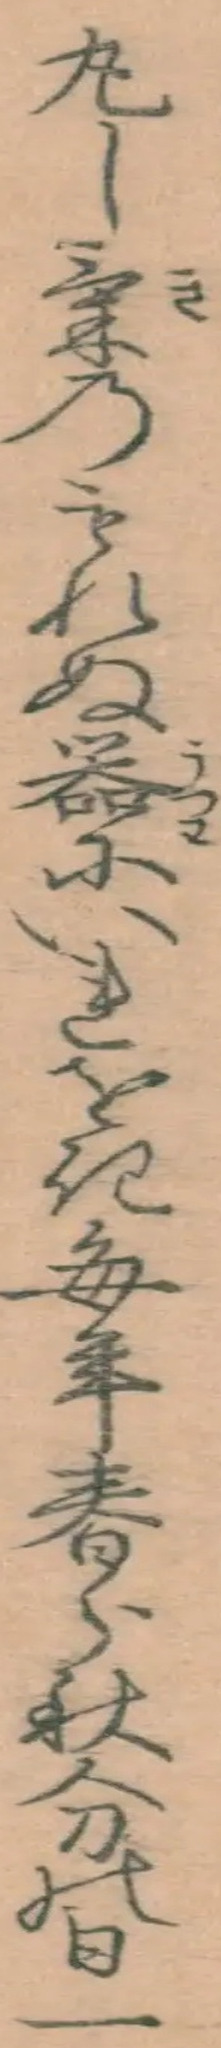丸し気のもれぬ器にいれをき毎年春分秋分の日一
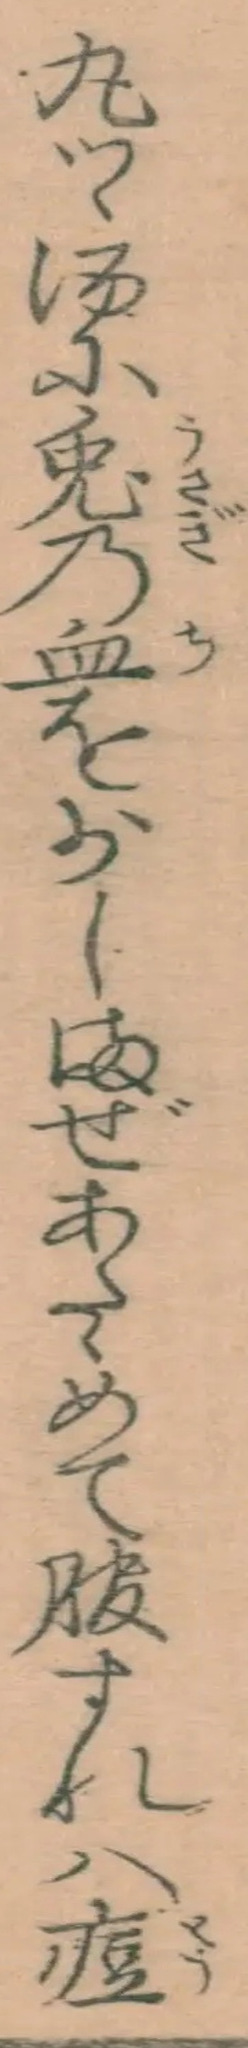丸つゝ酒に兎の血を少しまぜあたゝめて服すれは痘
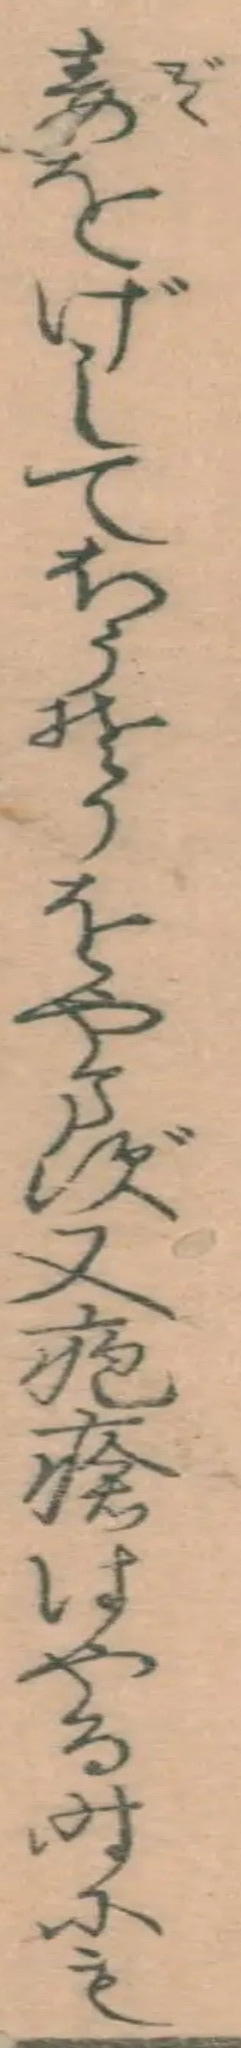毒をげしてほうそうをやまず又疱瘡はやる時にも
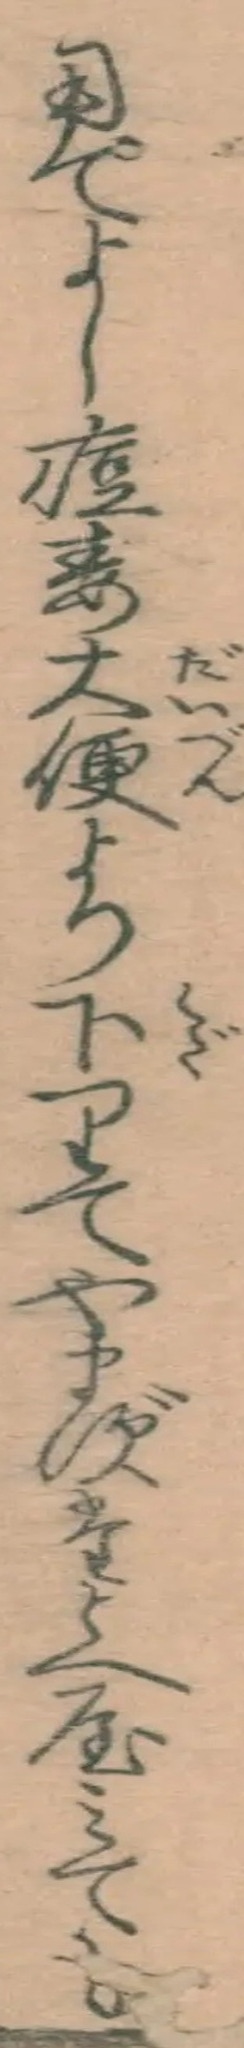用てよし痘毒大便より下りてやまずたとへやみても

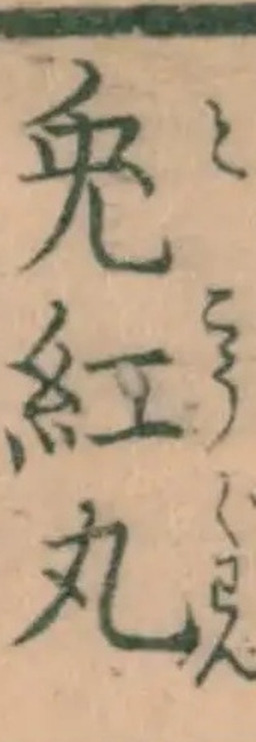兎紅丸
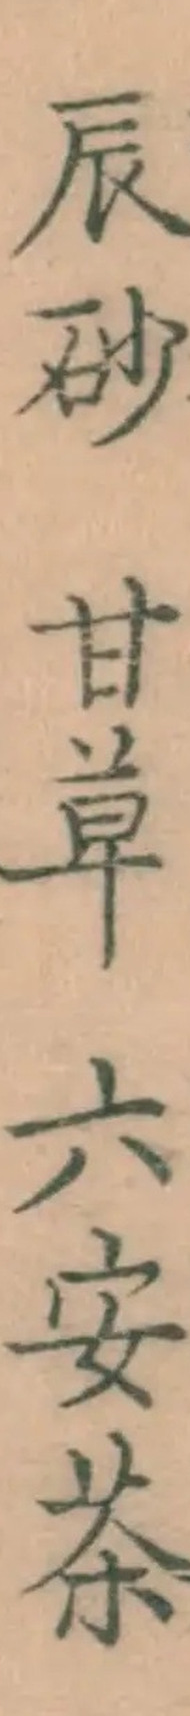辰砂甘草六安茶
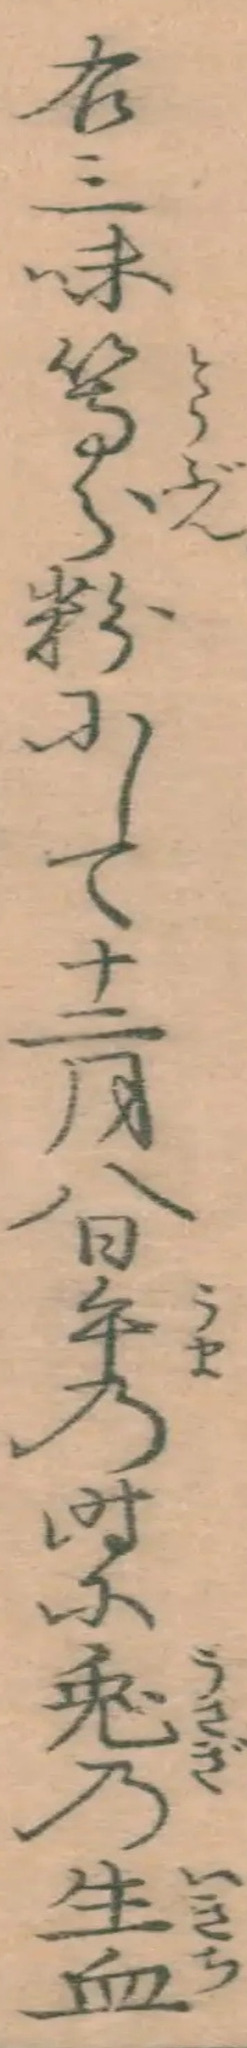右三味等分粉にして十二月八日午の時に兎の生血
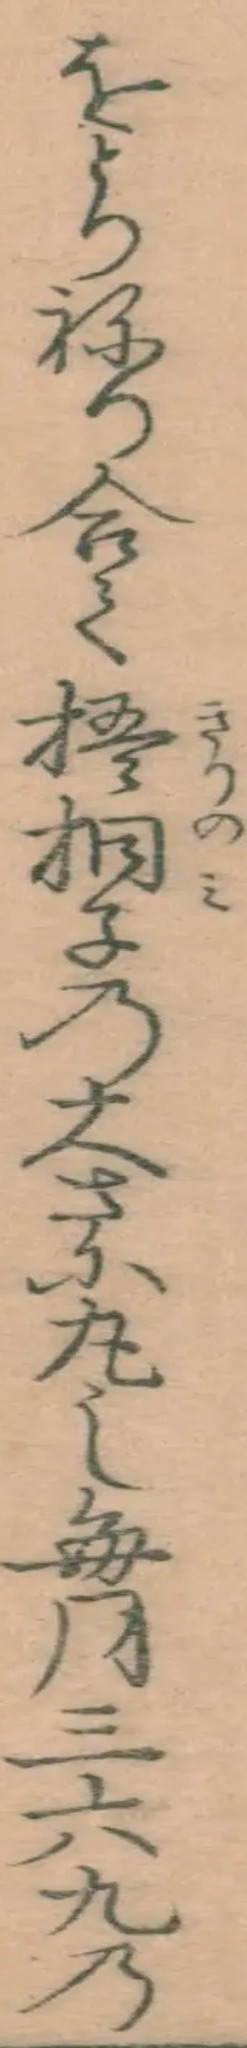をとりねり合て梧桐子の大さに丸し毎月三六九の
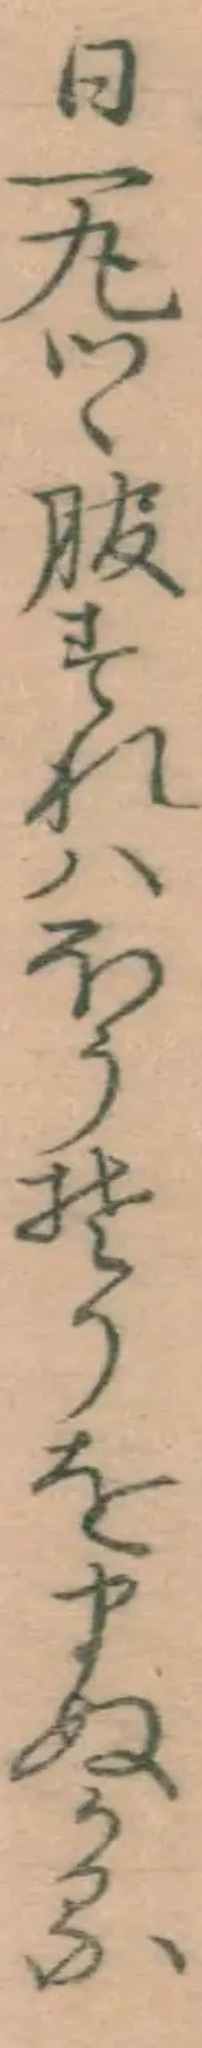日一丸つゝ服すれはほうそうをまぬかる
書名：雨夜談
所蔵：国立国会図書館 National Diet Library, JAPAN
